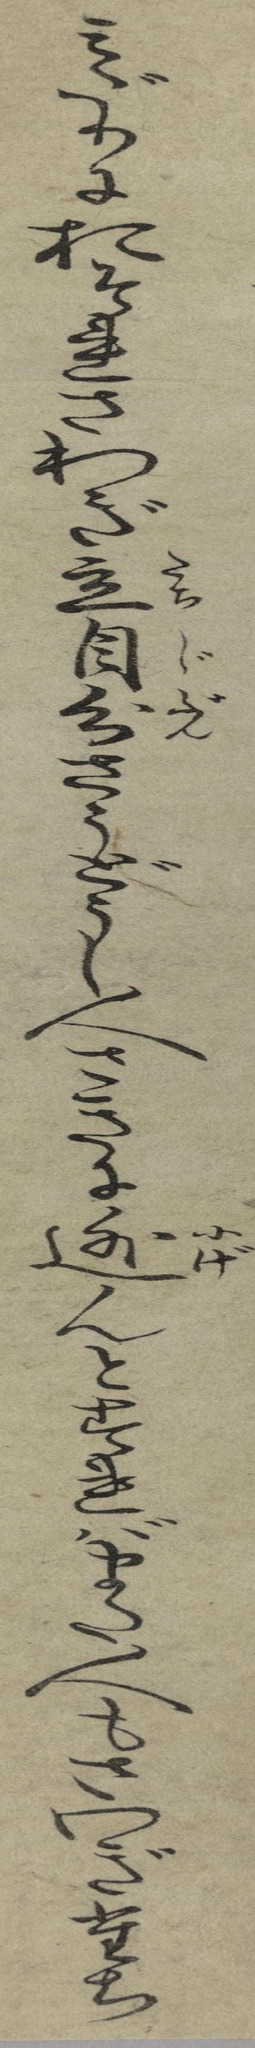みだりにおそれさわぎ立自分さうどうし人さきに迯んとすればまた人もさわぎたち
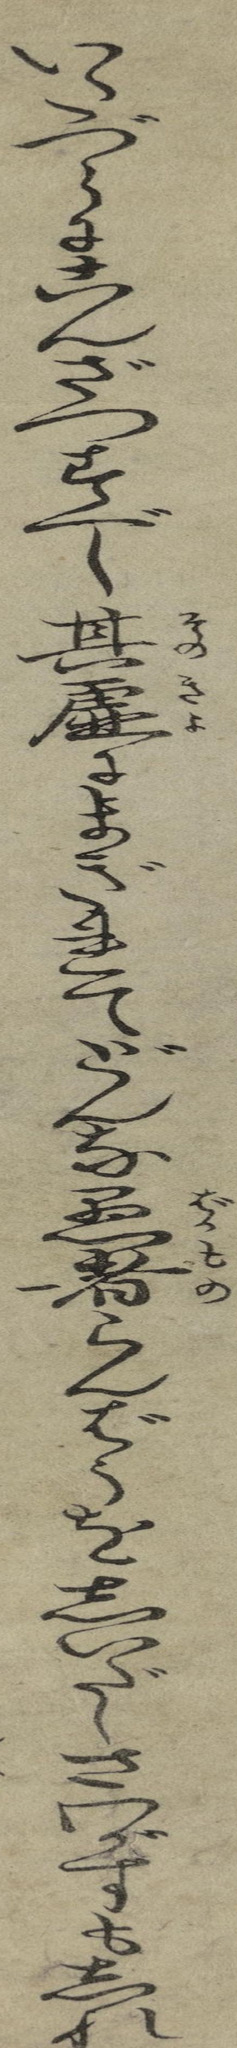いたづらにこんざつすべし其虚にばぎれてどんな愚者らんばうをしいだしさわがすもしれ
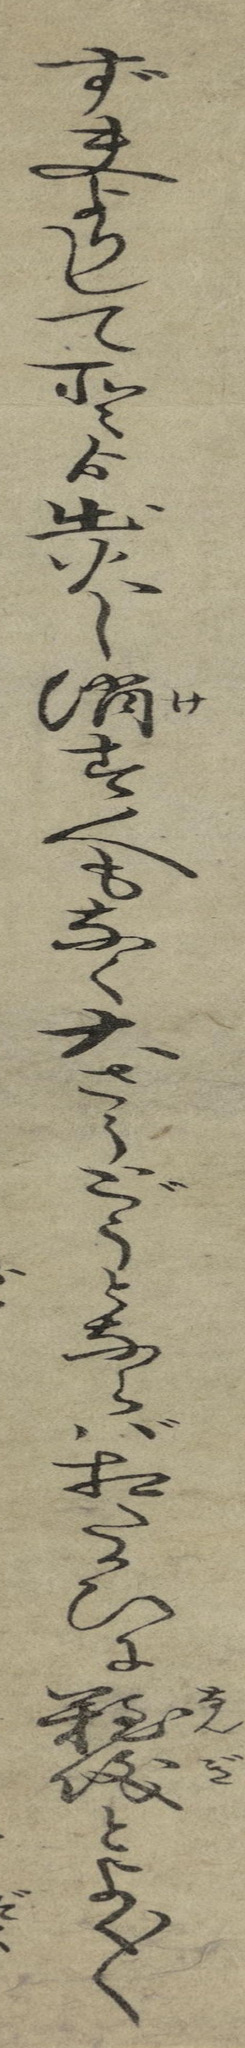ず夫よりして所〻ゟ出火し消す人もなく大さうどうとならば相たかひに難儀とよく〳〵
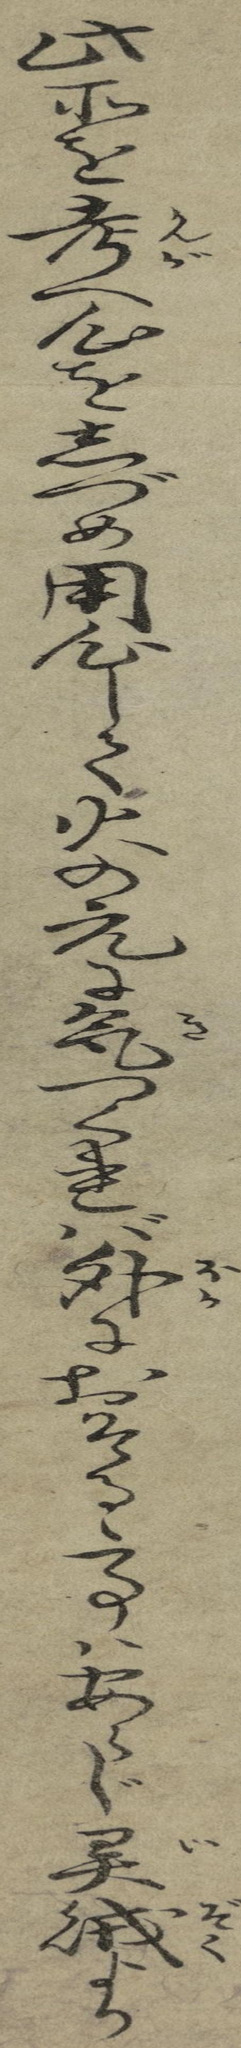此所を考へ心をしづめ用心して火の元に気つくれば外におそるゝ事はあらじ異賊より
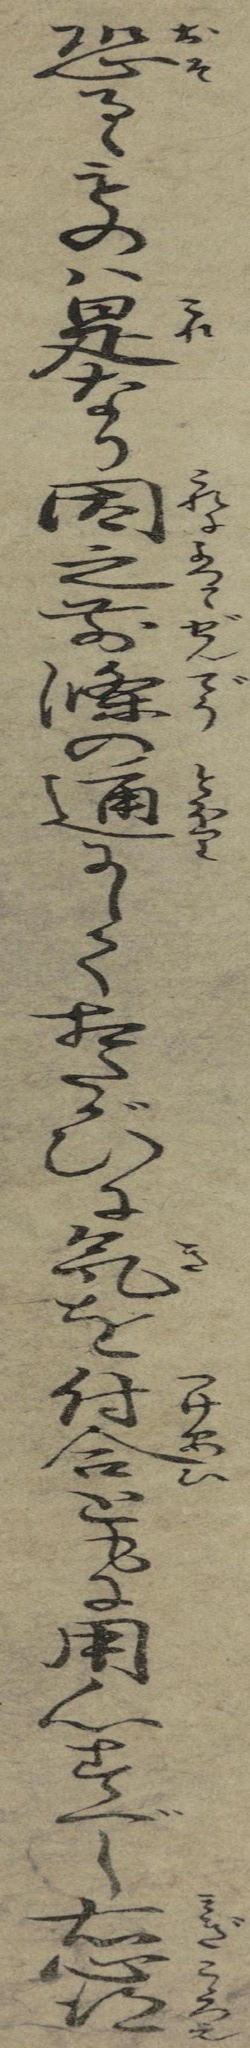恐るゝものは是なり因之前条の通にして相たがひに気を付合ともに用心すべし右心得
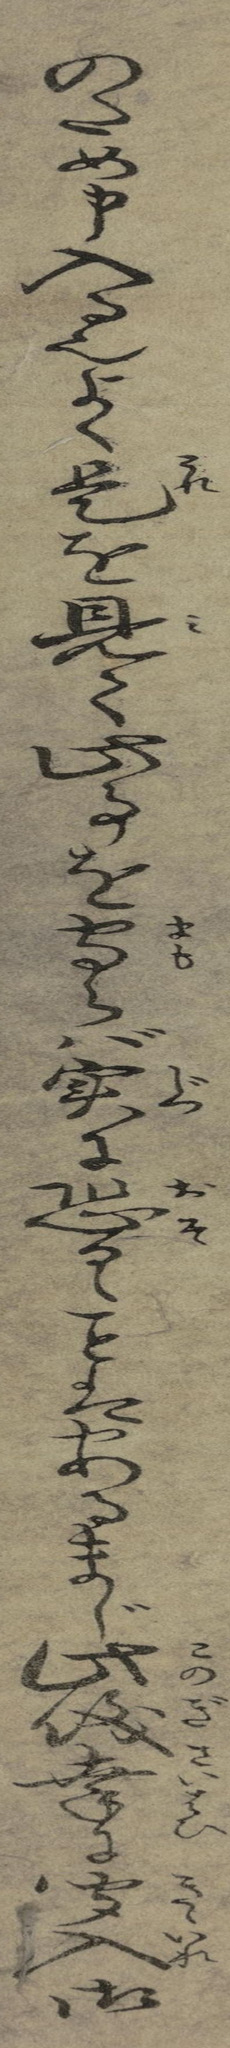のため申入る也よく是を見て此事を守らば実に恐るゝことはあるまじ此儀幸に聞入御
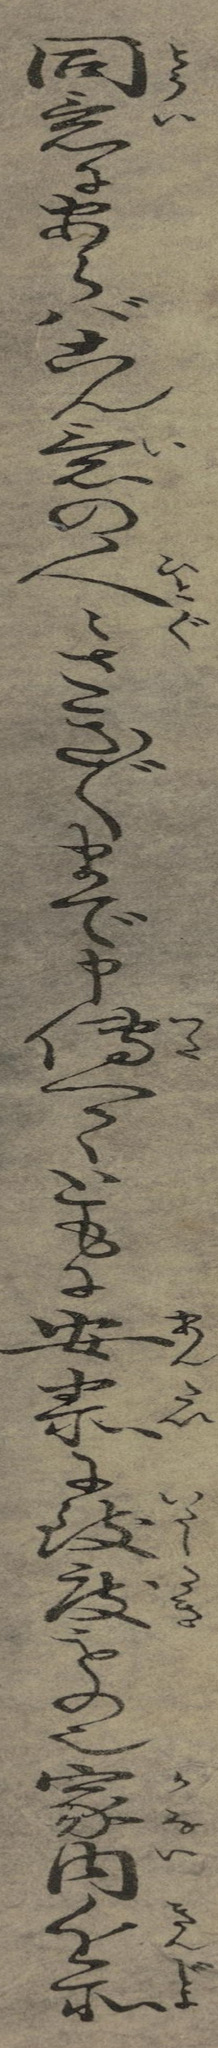同意にあらばこん意の人〻さき〴〵まで申伝へてともに安泰に致度もの也家内近所
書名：火の元用心肝要之事・諸人安全心得の事
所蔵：東京大学地震研究所図書室 Earthquake Research Institute Library, The University of Tokyo, JAPAN
